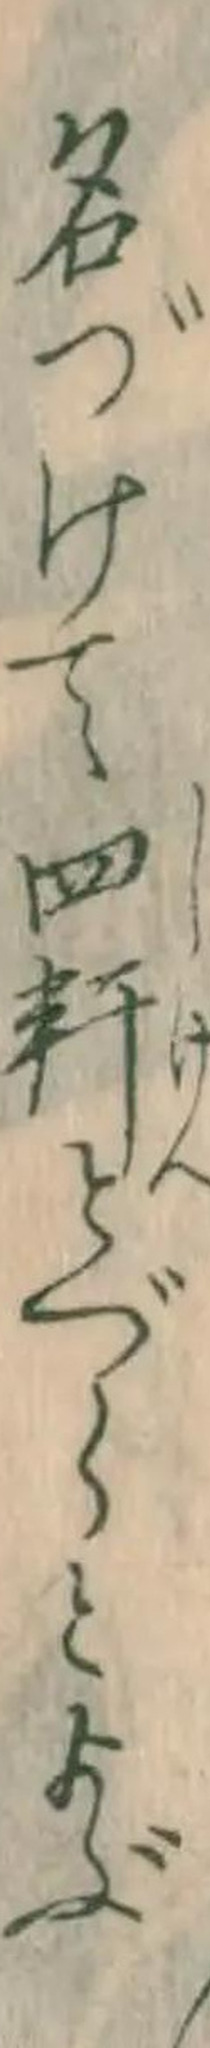名づけて四軒とべらとよぶ

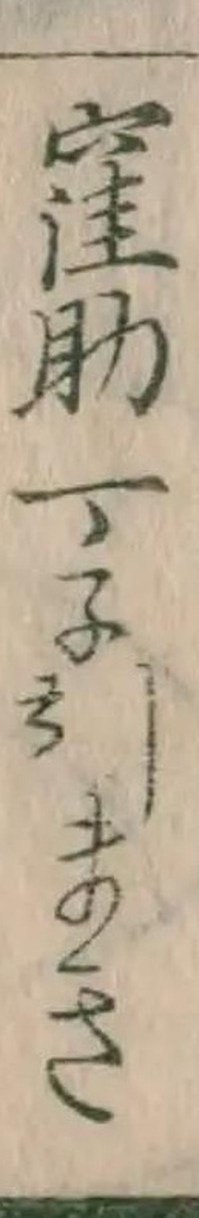窪助丁子引まき
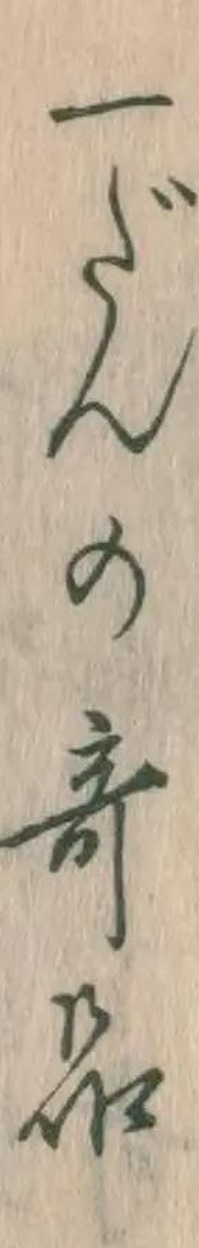一だんの奇品
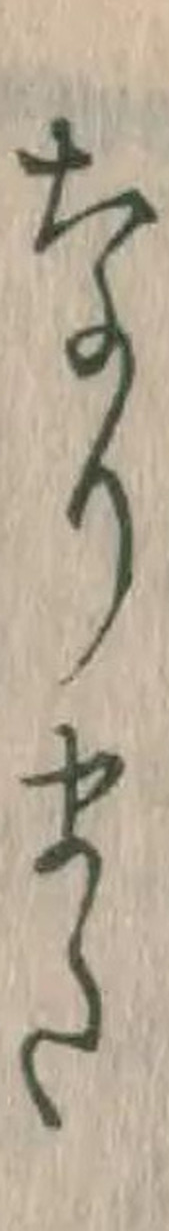なりまた
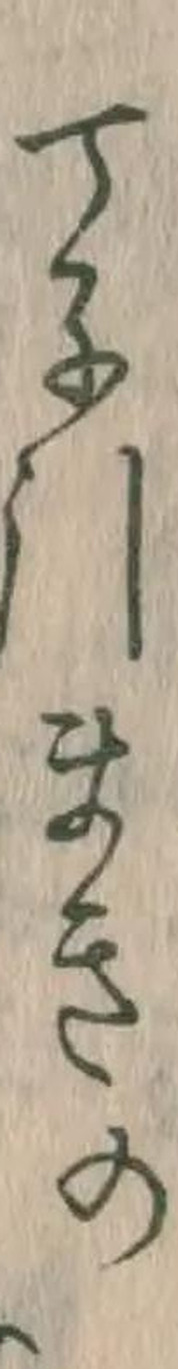丁子引まきの
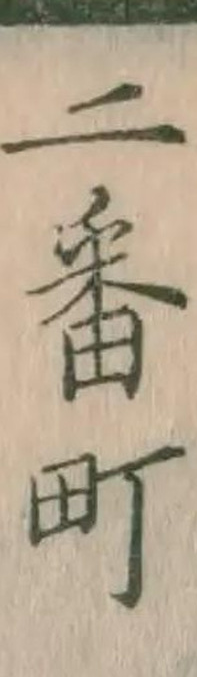二番町
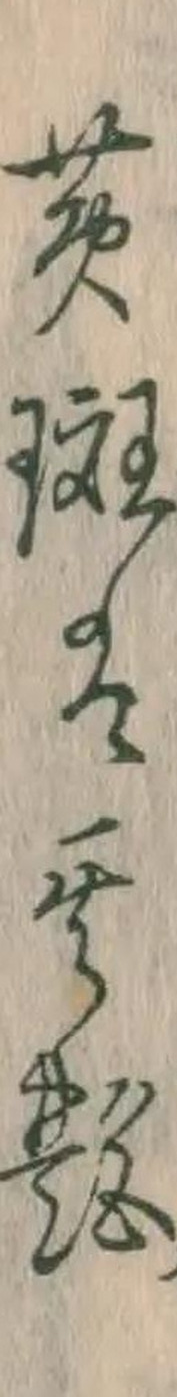黄斑は其艶
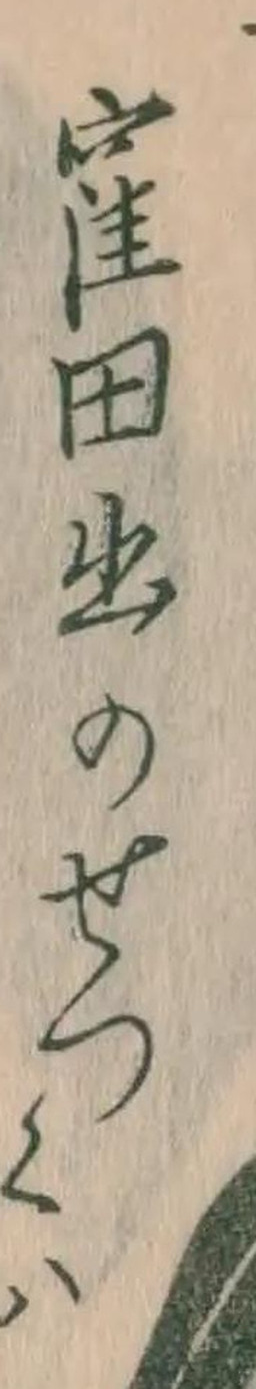窪田出のせつくは
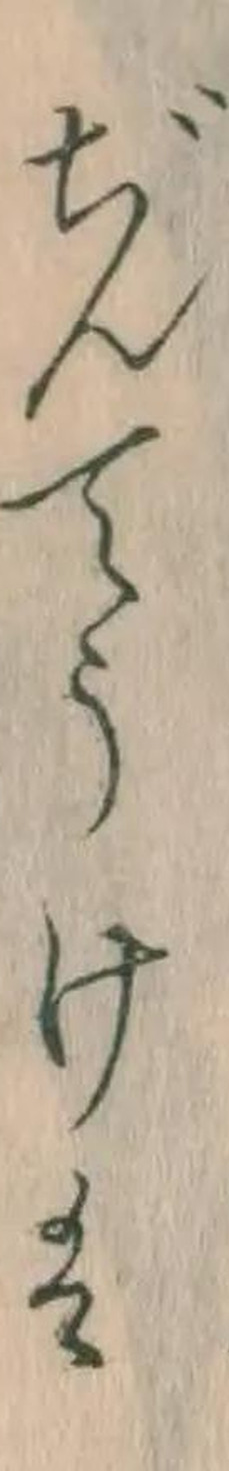じんてうけは
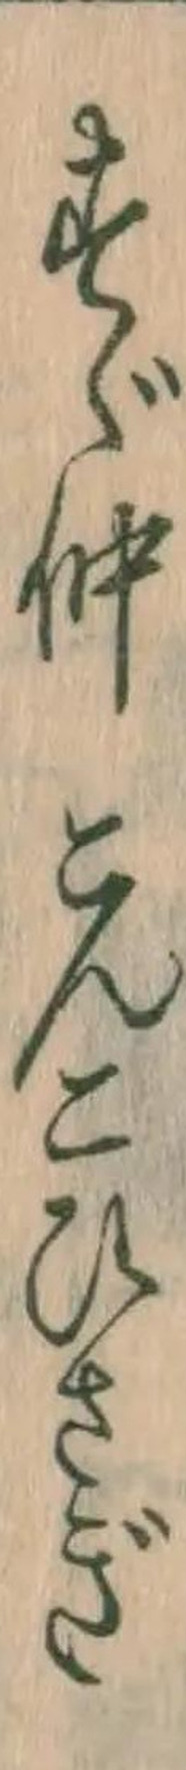すゞ仲こんこひさぎ
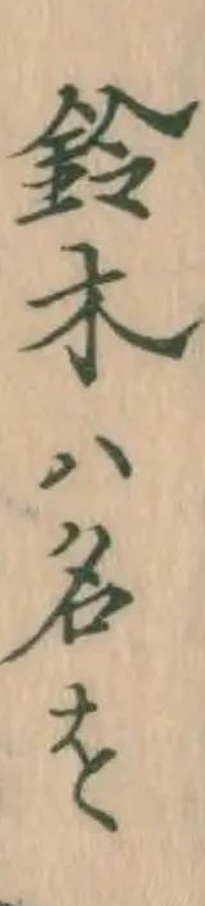鈴木は名を
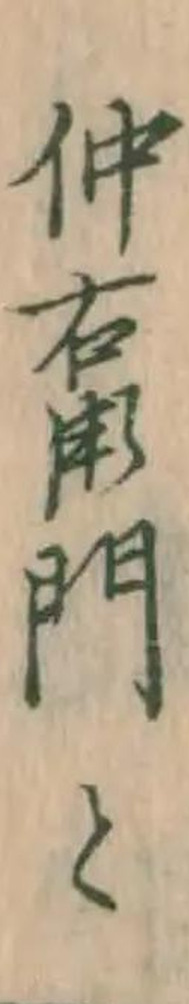仲右衛門と
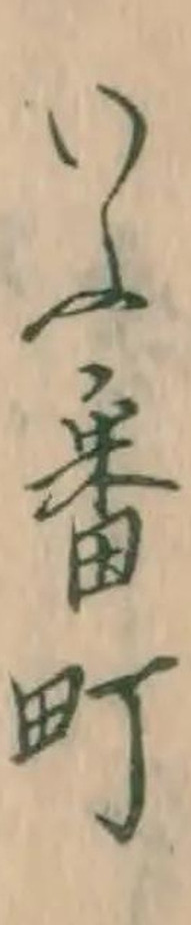いふ番町
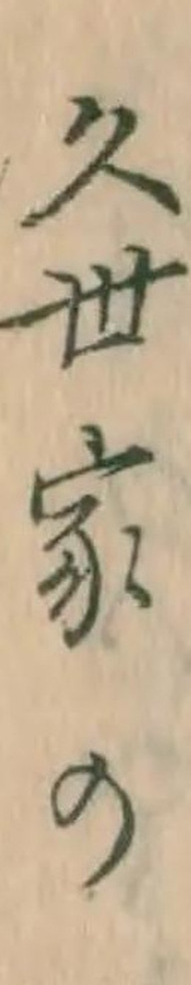久世家の
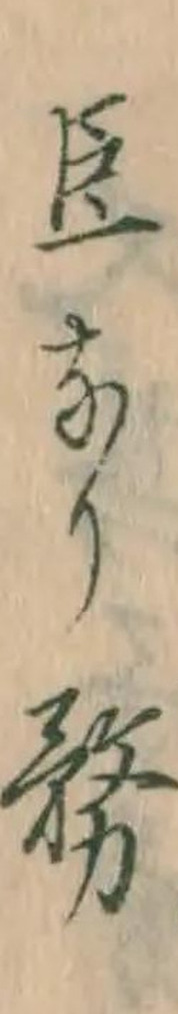臣なり務
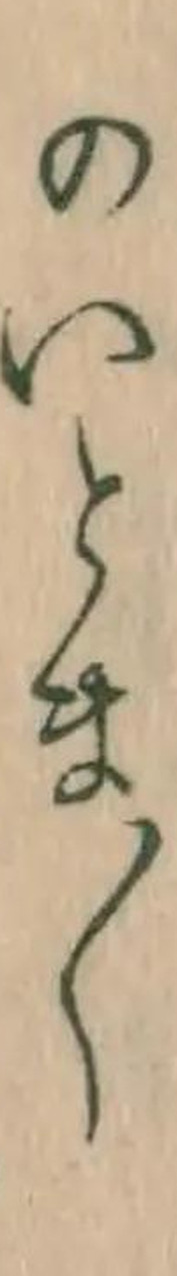のいとま〳〵
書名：草木奇品家雅見 3巻. [2]
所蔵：国立国会図書館 National Diet Library, JAPAN
